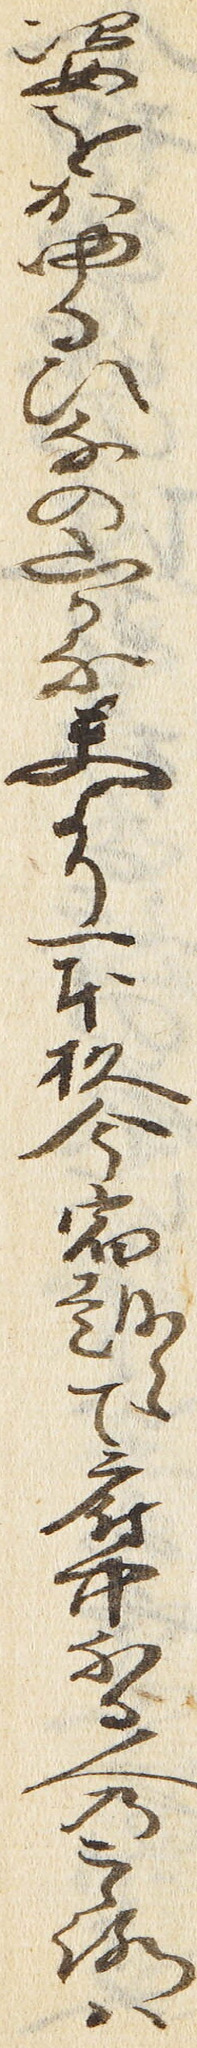姿をかゆるひなの山かな夫より一本杉今宿越えて府中なる人のこころは
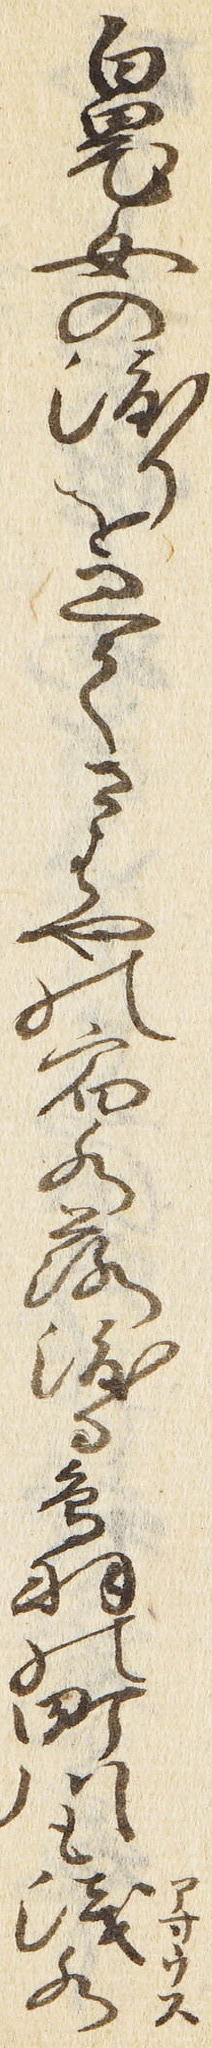白鬼女の渡りを過てさはやの宿水落渡る鳥羽の町川も浅水
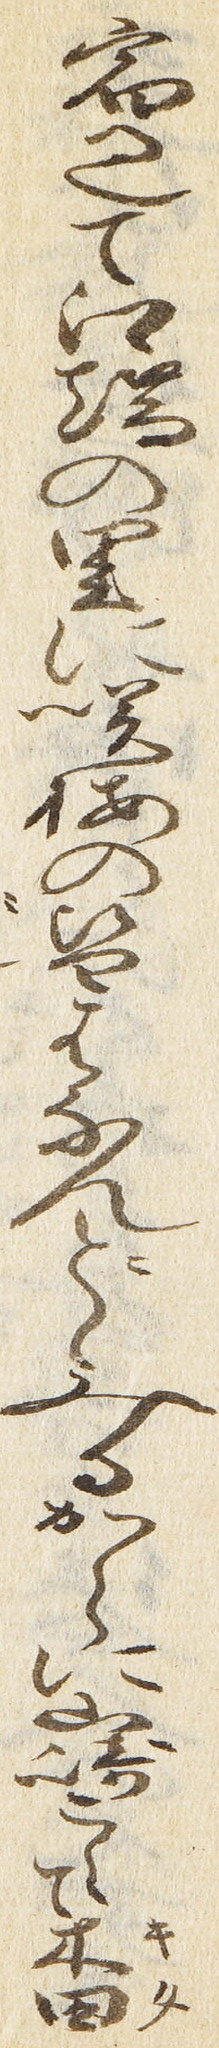宿過て江端の里に咲梅の皆はなんどゝみるからに山崎こえて木田
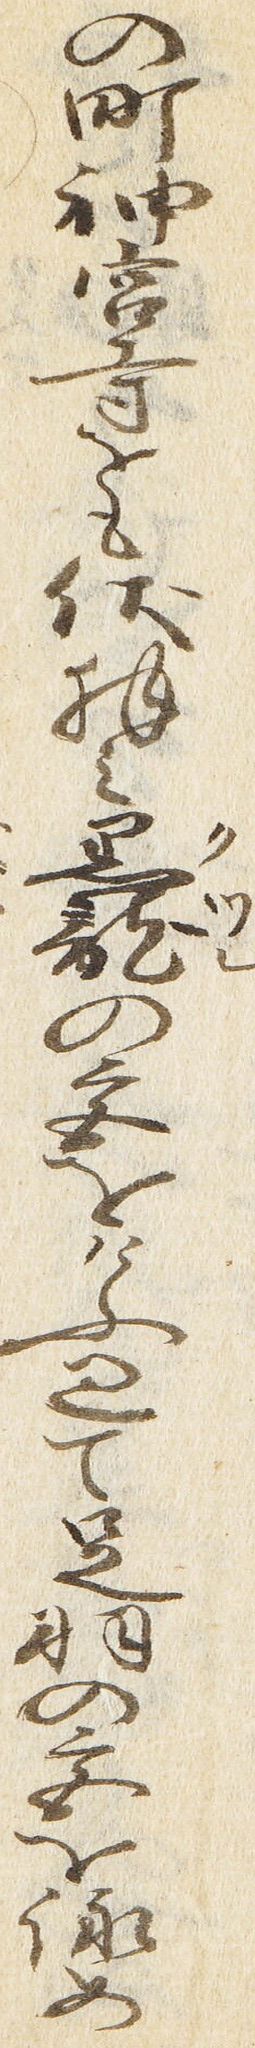の町神宮寺をも伏拝み黒龍の宮をけふ廻て足羽の宮を詠め
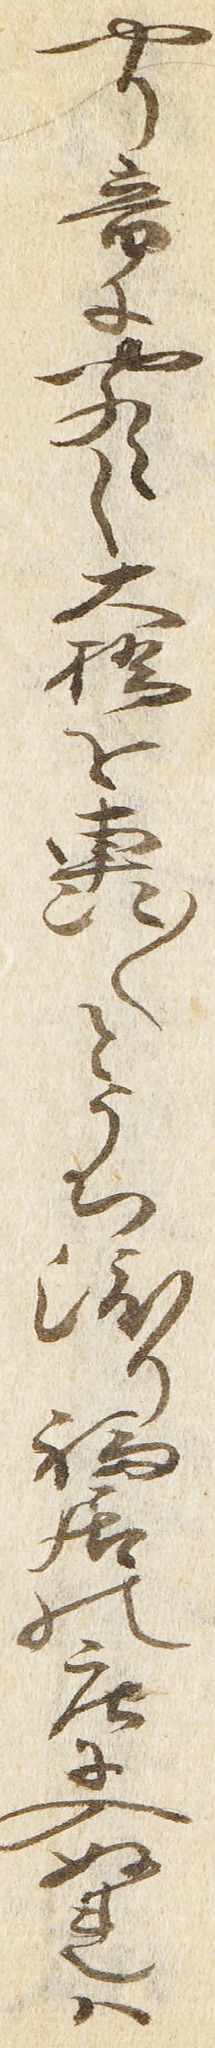やり音に聞えし大橋を轟〳〵とうち渡り福居の庄に入ぬれは
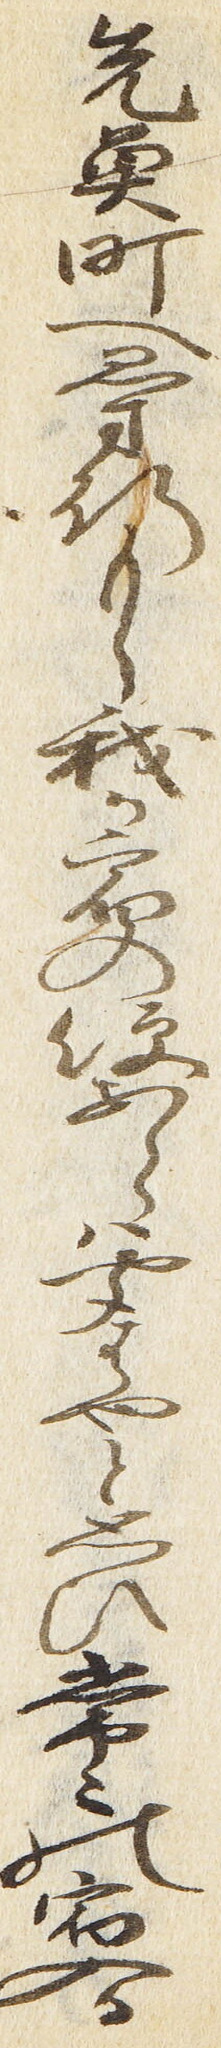先魚町へ尋行もし我か宿の便あらは聞はやと思ひ常々の宿入る
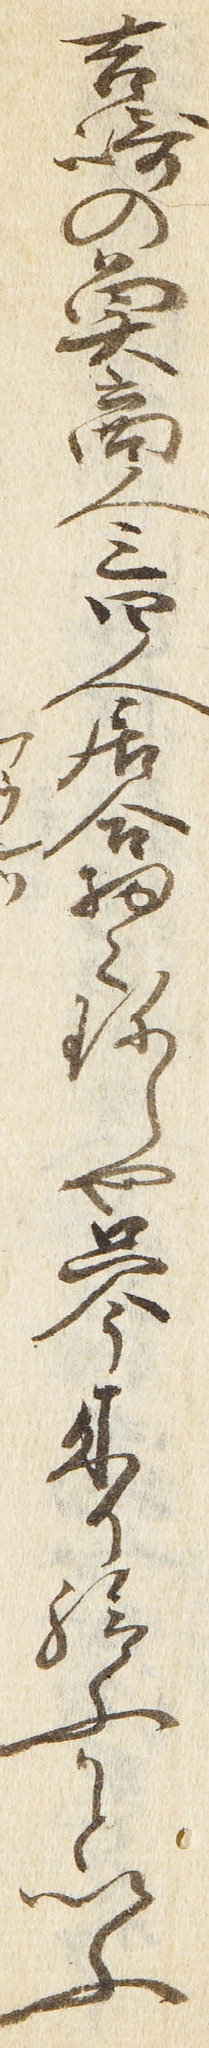吉崎の魚商人三四人居合扨々珎しや只今来り給ふかといふ
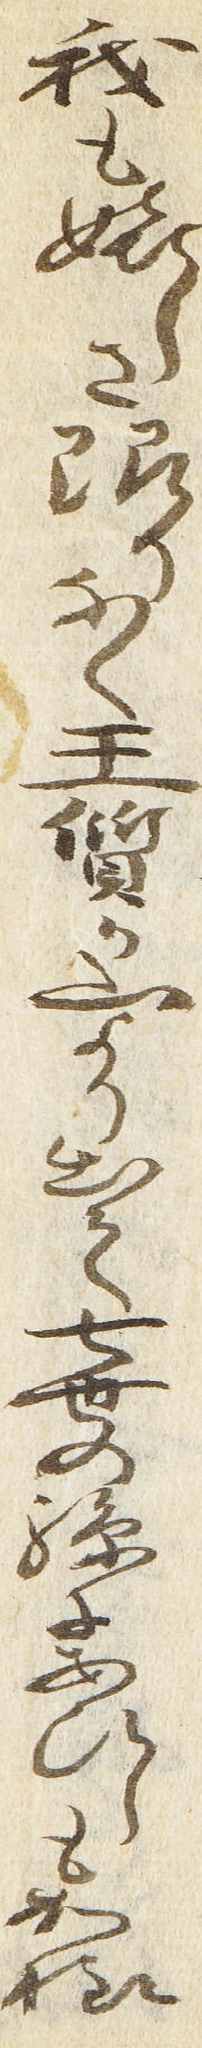我も嬉しさ限りなく王質か山より出て七世の孫にあひしもか様
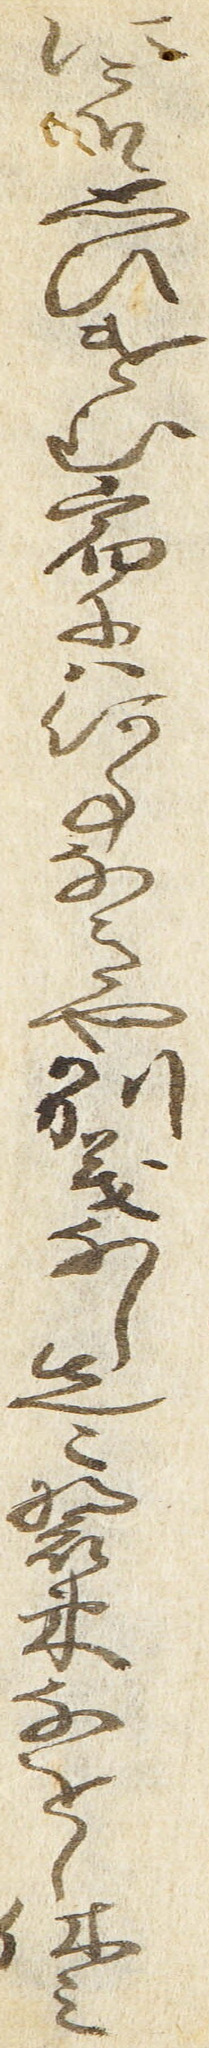にこそ思ひけむ宿には何事なきや別義なし先々装束なをし休み
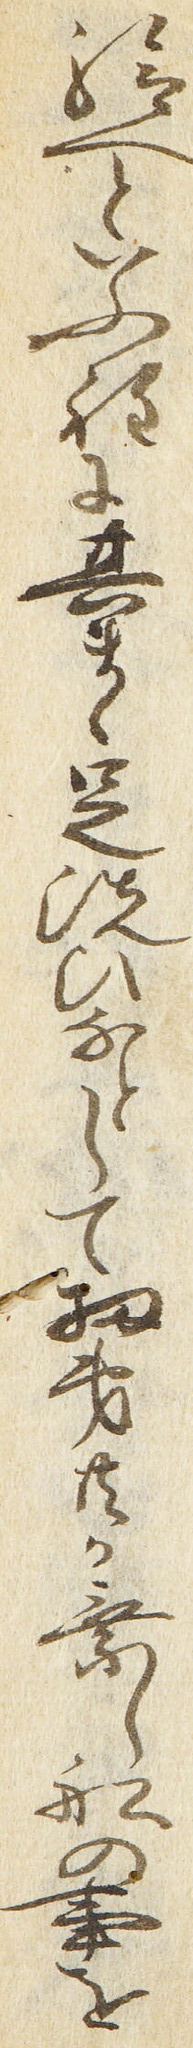給へといふ程に其まゝ足洗ひなとして扨弟共か乗し船の事を

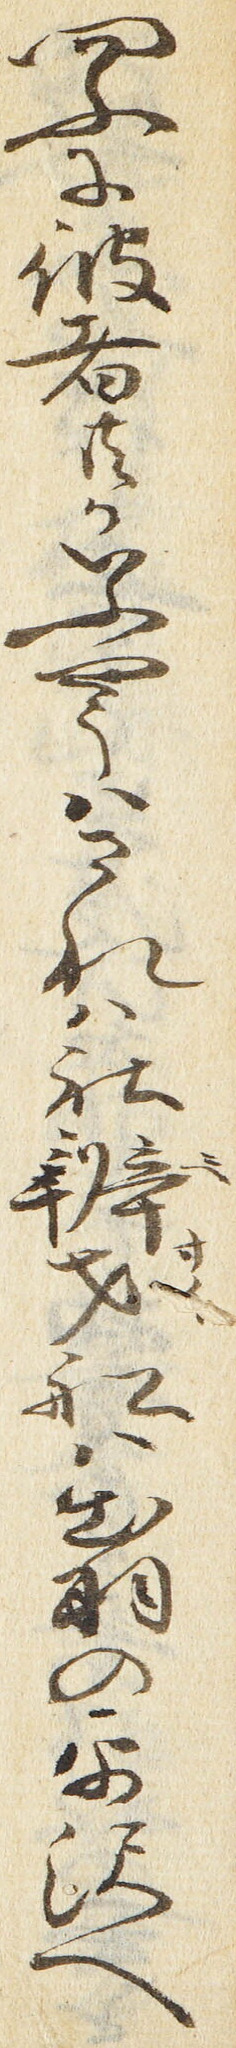問ふに彼者共かいふやうはされは社弁才船は出羽の平沢へ
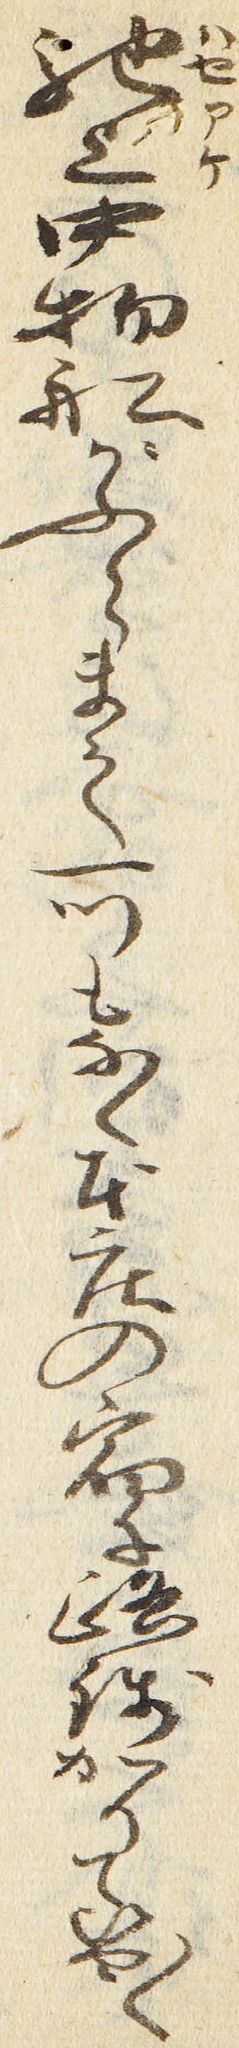馳上中物船がふらまて一つもなく本庄の宿に路銭かりて替〳〵
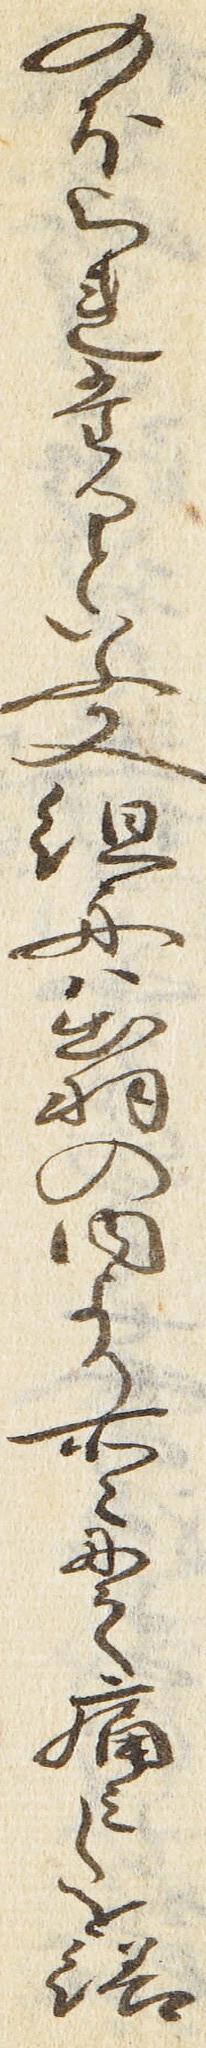のほられたるといふ又組舟は出羽の内より所々にて痛みしを繕
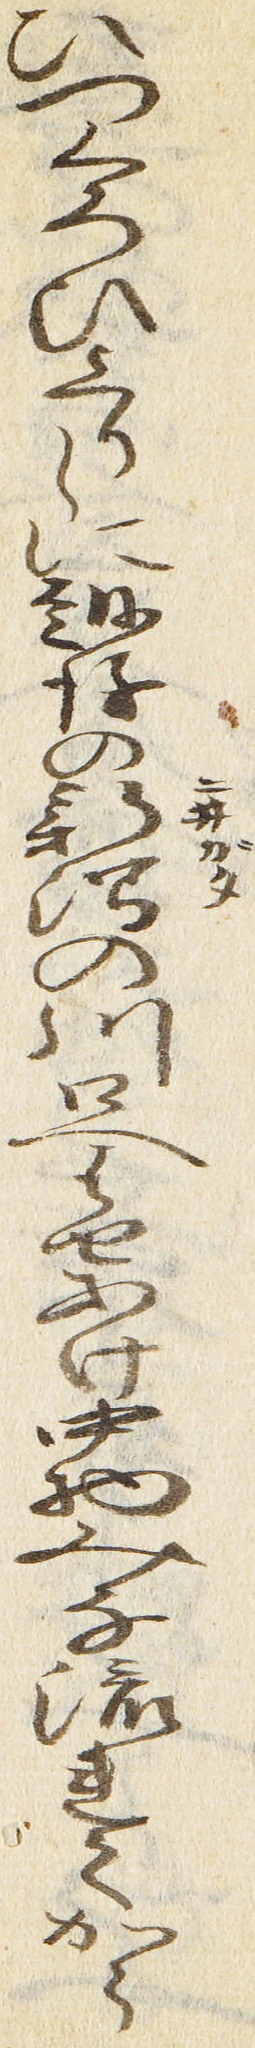ひつくろひ上りしに越後の新潟の川口へはせあけ中物みな流れてから
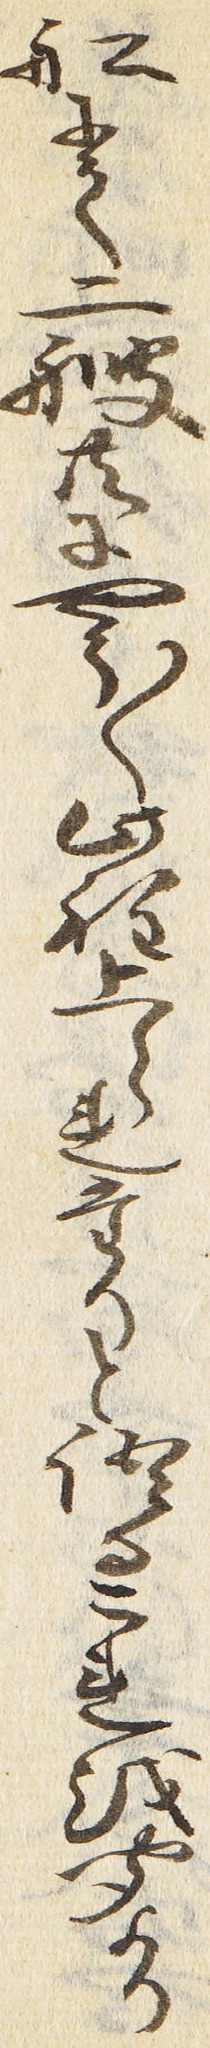船にて二艘共にやう〳〵此程上られたりと語るこれを聞より
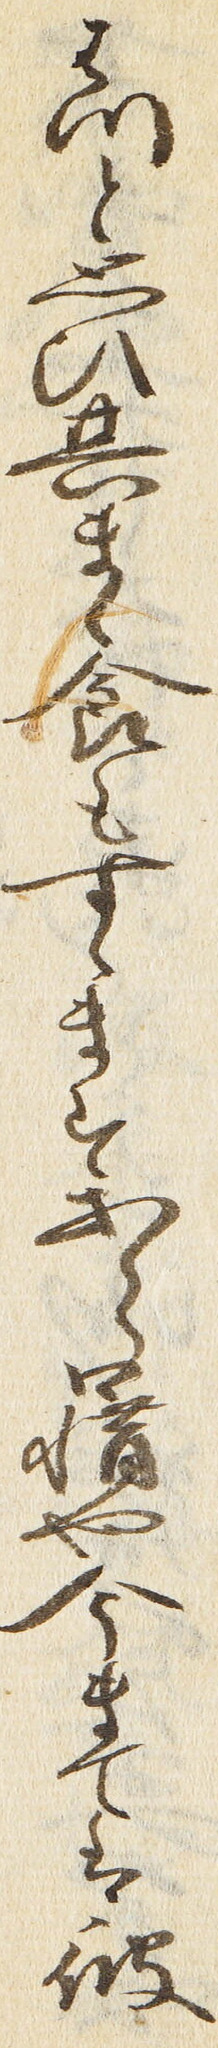はつと思ひ其まゝ食もすゝますあら口惜や今まては彼
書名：海陸世話日記
